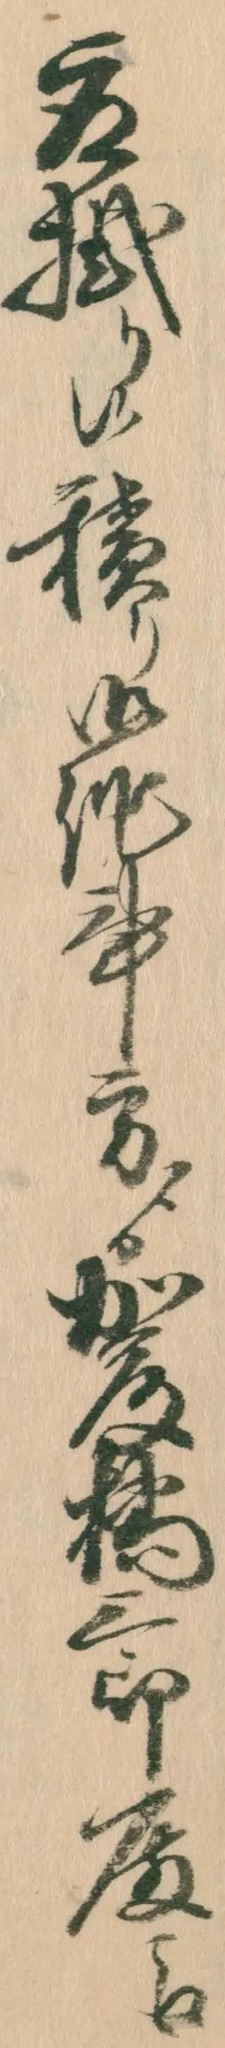取掛り候積り御作事方ゟ加藤橘三郎殿え
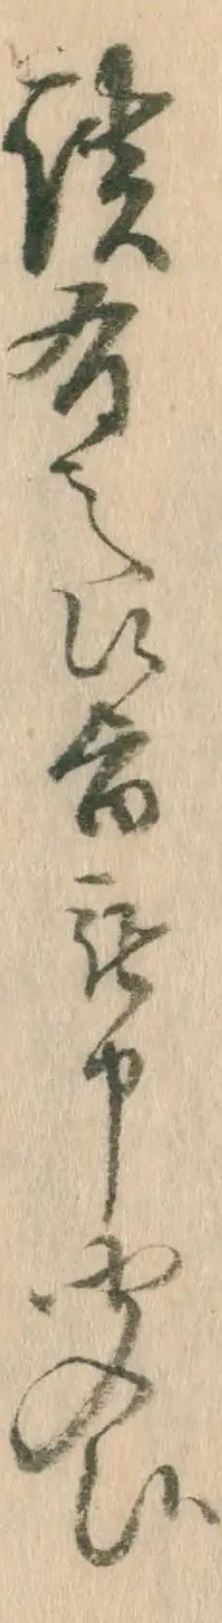談有之候旨被申聞候

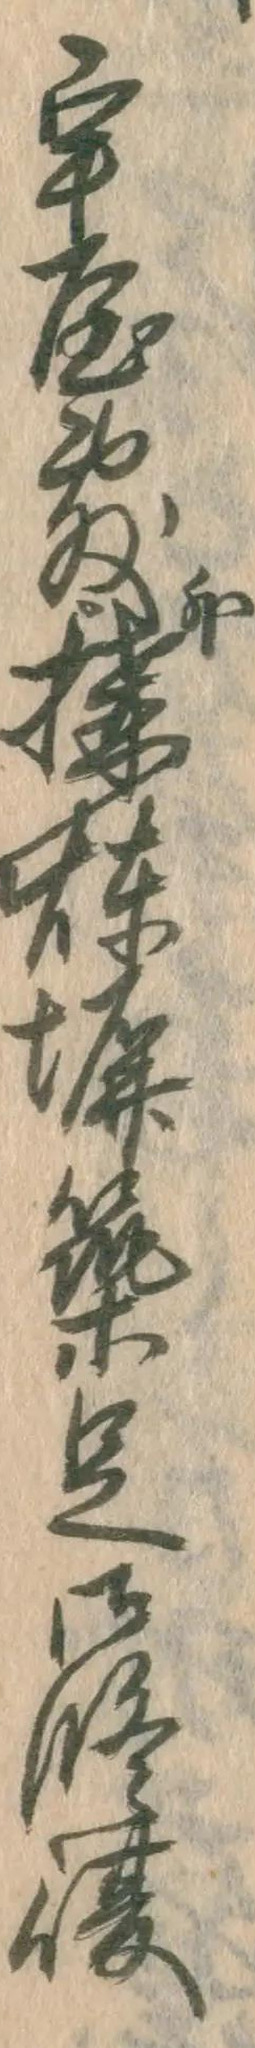│牢屋敷外構煉塀築足御修復
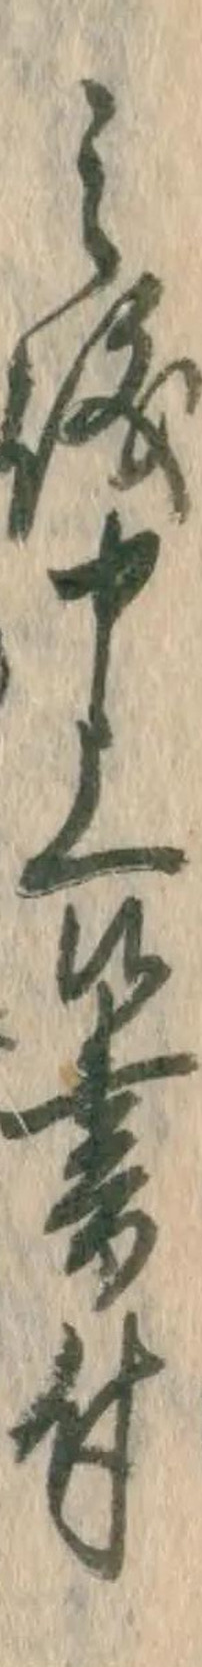│之儀申上候書付
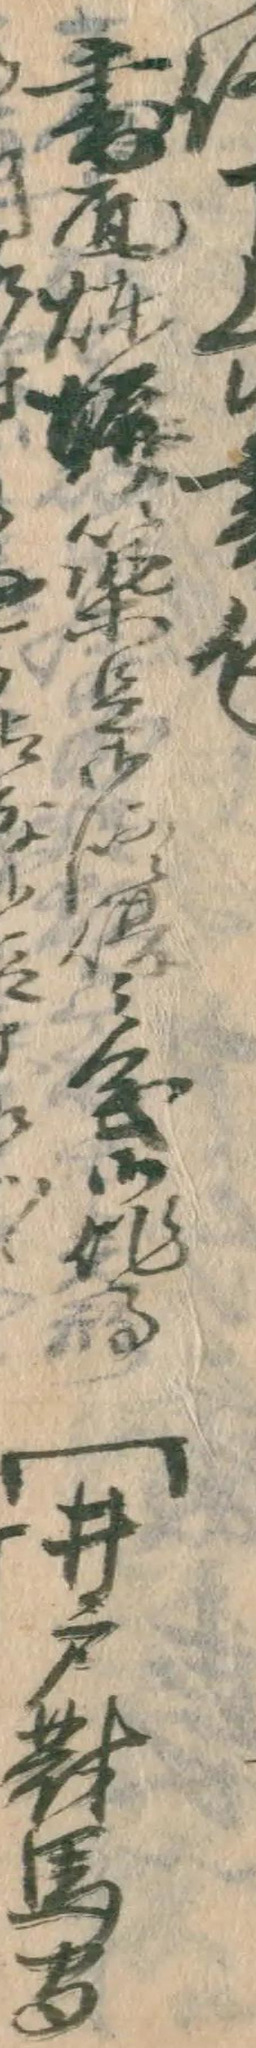│書面煉塀築足御修復之義御作事[井戸対馬守
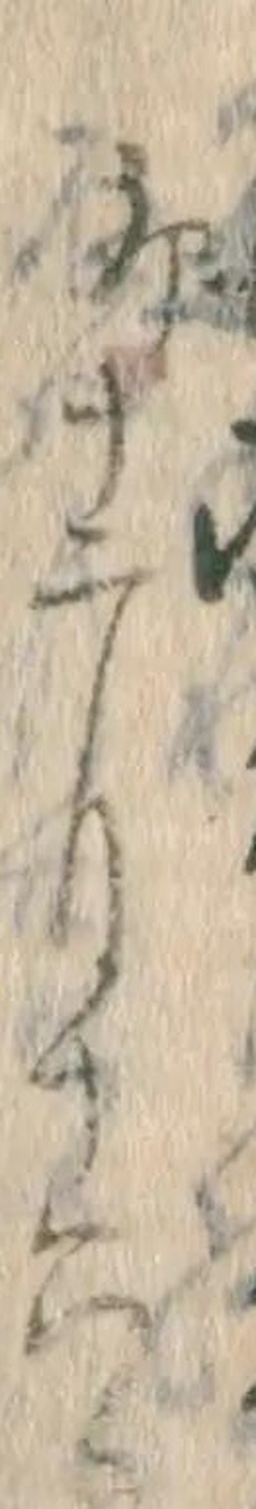│卯十二月十六日
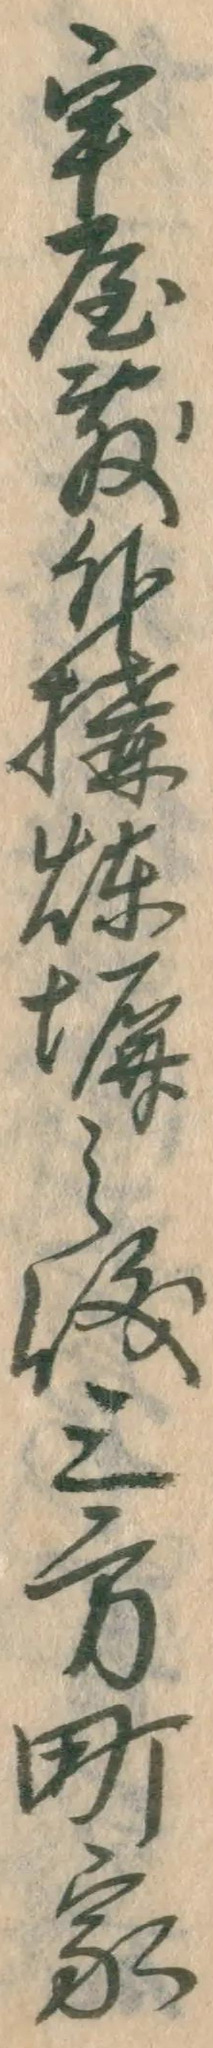牢屋敷外構煉塀之儀三方町家
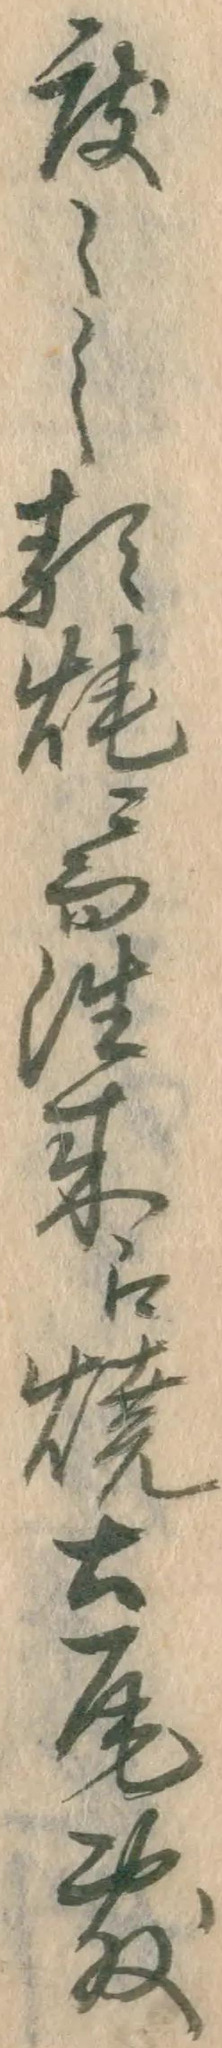度〻之類焼ニて往来え焼土瓦敷

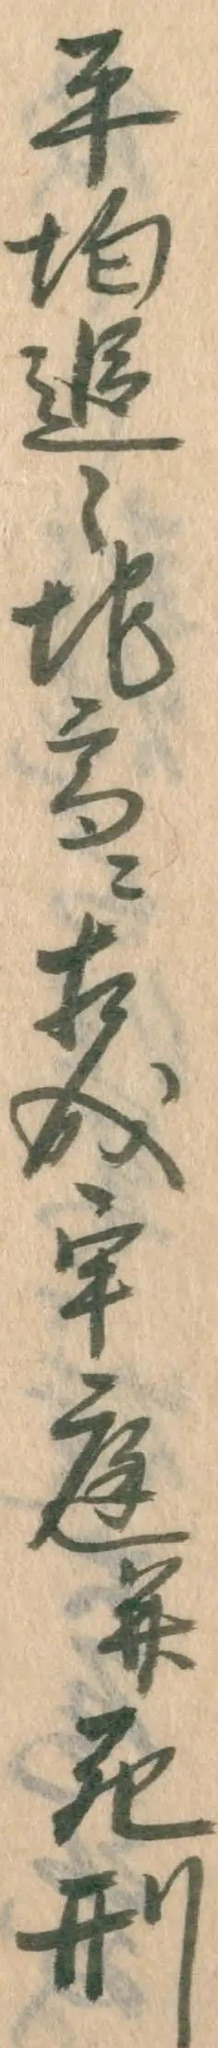平均追〻地高ニ相成牢庭幷死刑
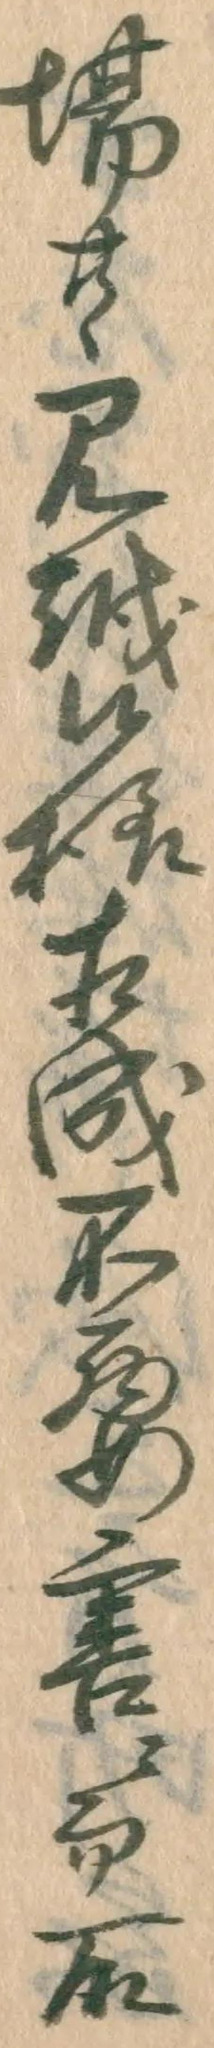場共見越候様相成不要害ニて取
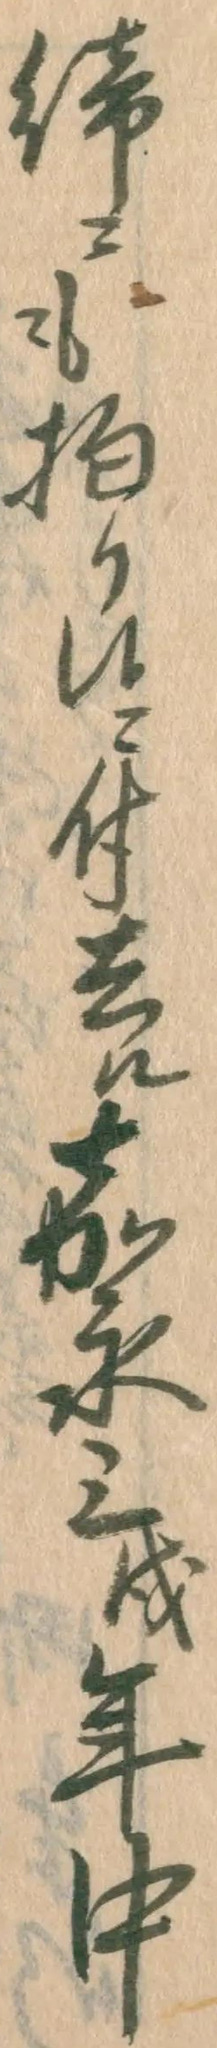締ニも拘り候ニ付去ル嘉永三戌年中
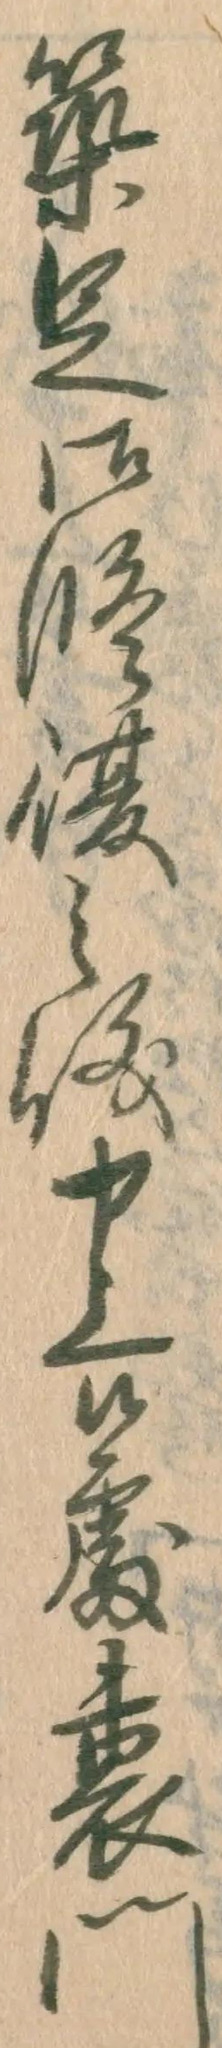築足御修復之儀申上候処裏門
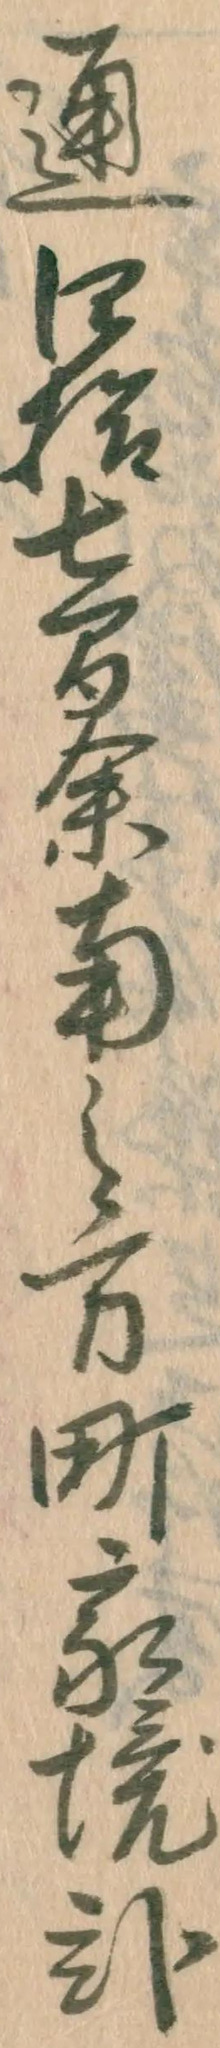通四拾七間余南之方町家境弐
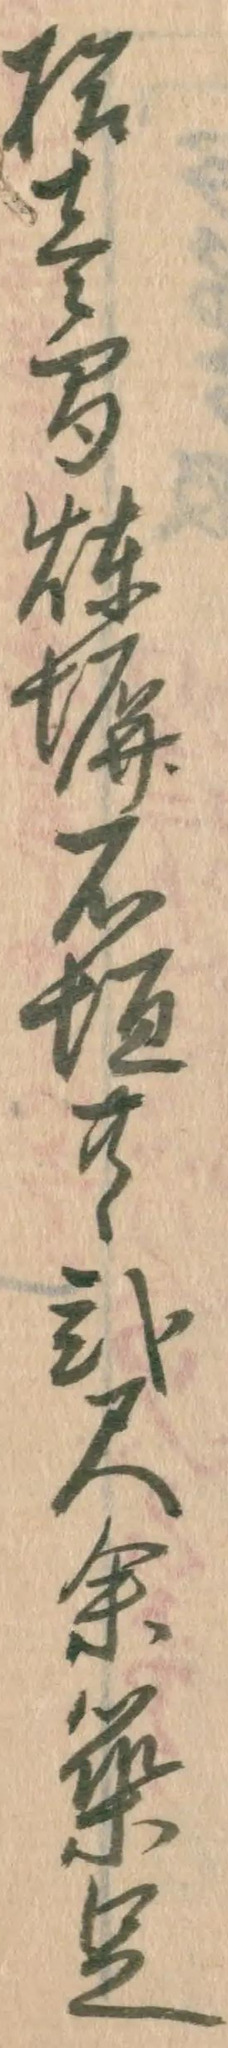拾壱間煉塀石垣共弐尺余築足
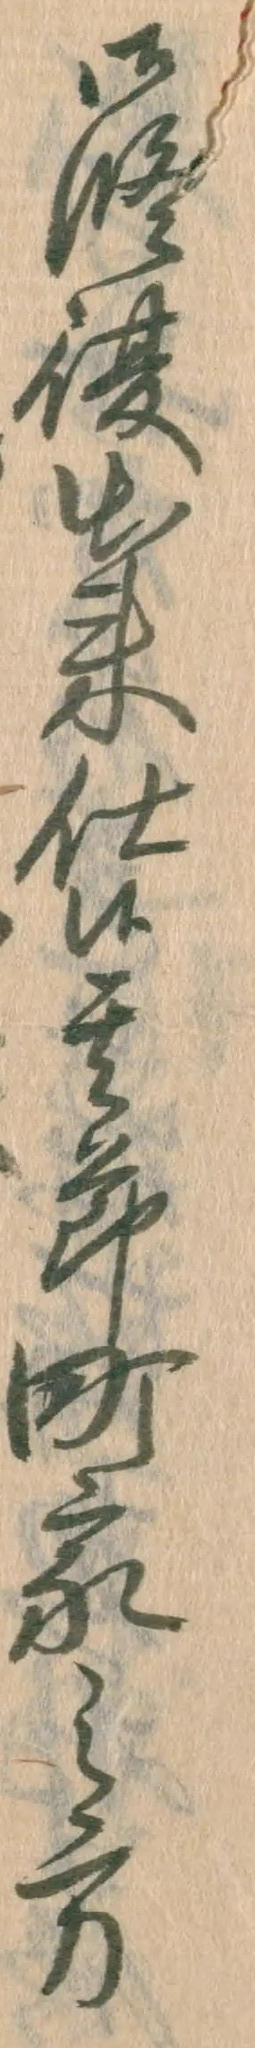御修復出来仕候其節町家之方
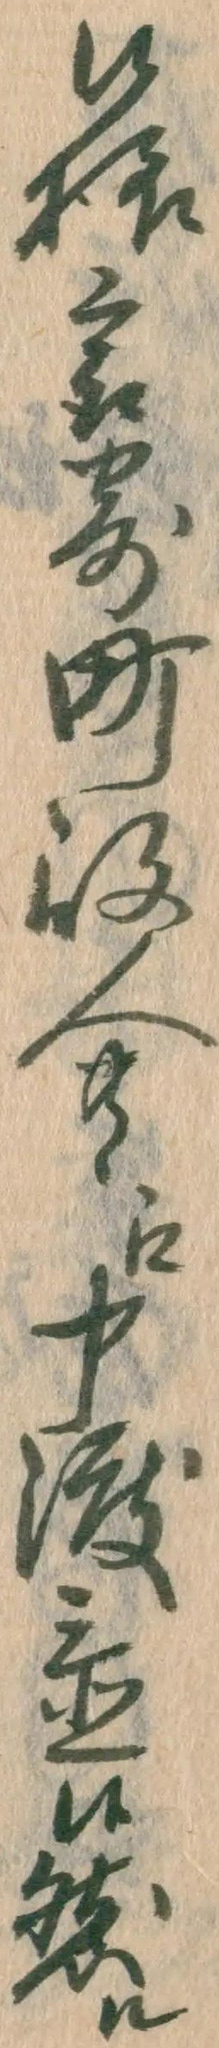候様最寄町役人共え申渡置候然ル
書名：七十冊物類集 71巻. [44] 四十三 牢屋敷御普請御修覆地震ニ付骨折候牢屋掛御褒美之部
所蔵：国立国会図書館 National Diet Library, JAPAN
